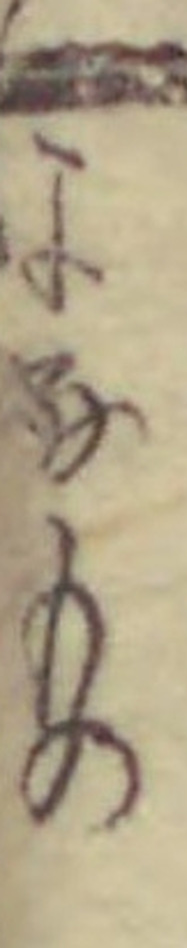よなもの
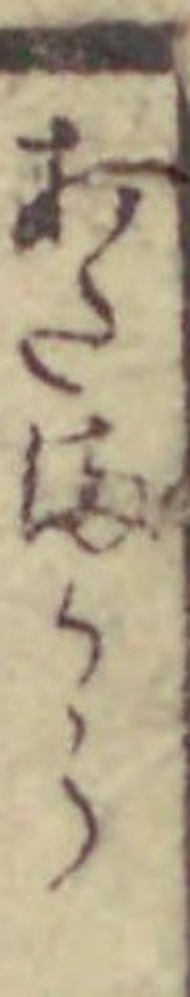あたまから
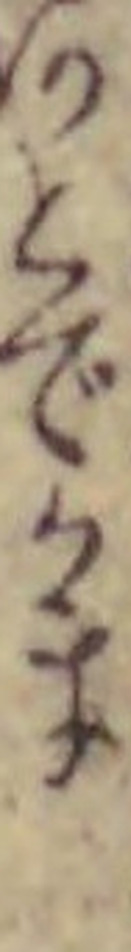あとでかま
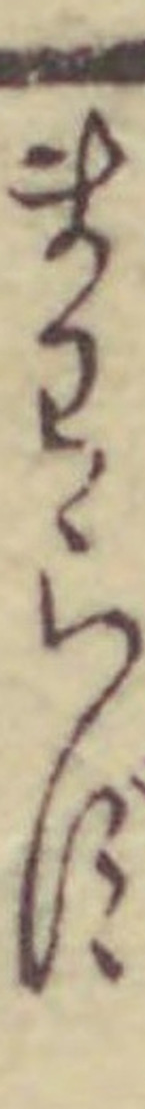まわらず
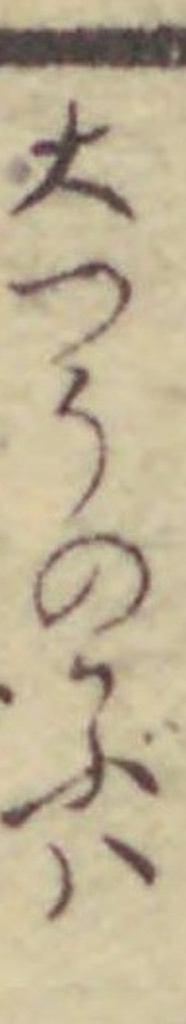大つうのかぶは
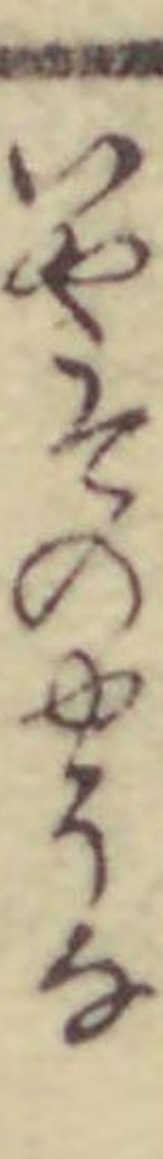いやそのやうな
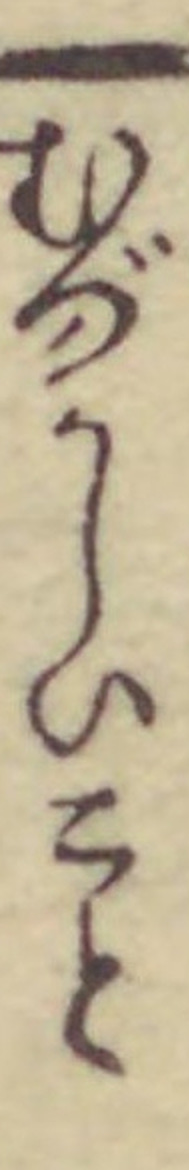むづかしいこと
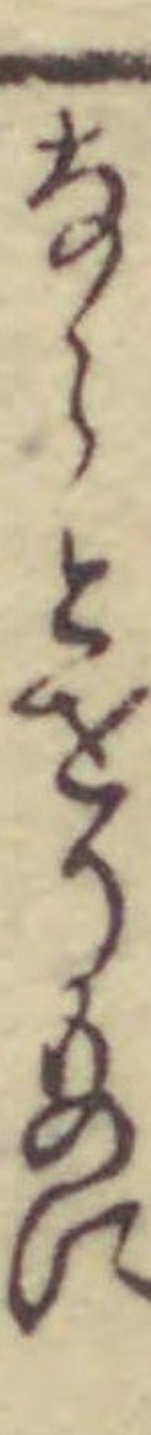ならとをりものに
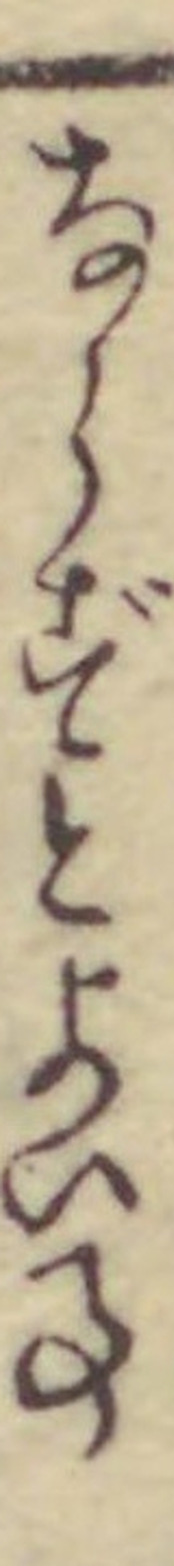ならずとよい事
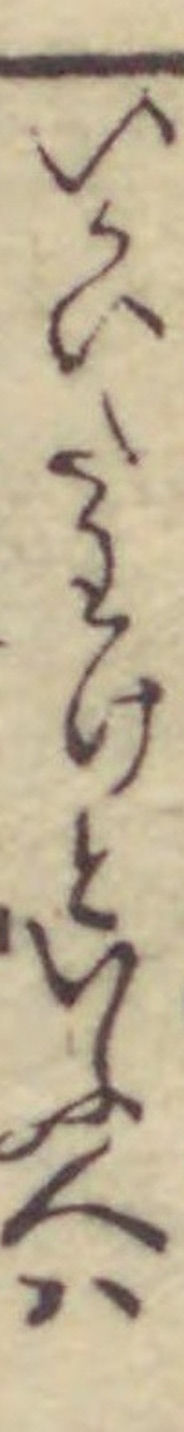いかいたわけといふひとは
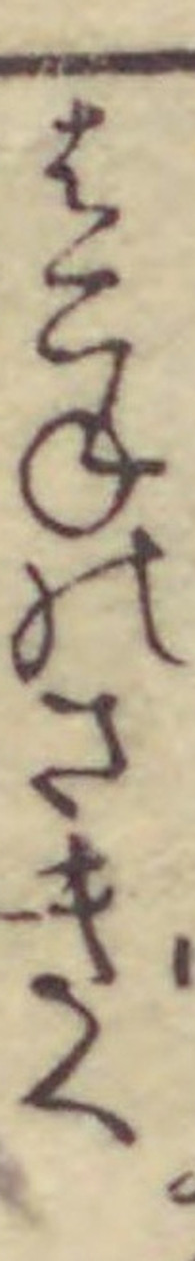はこねのさきへ
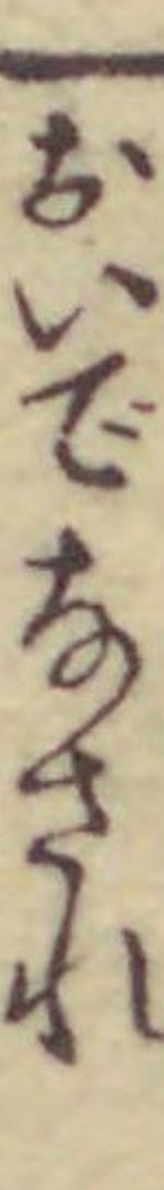おいでなされ
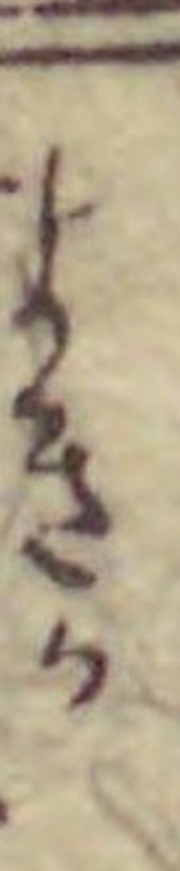まきか
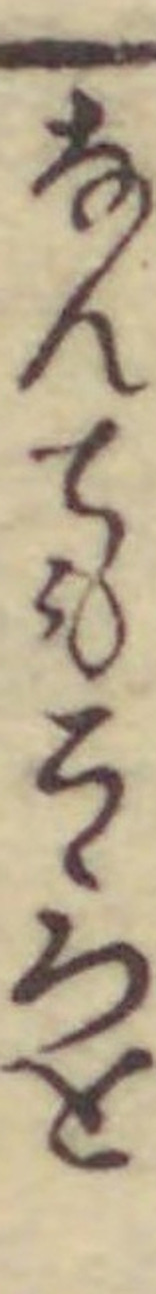なんてもこゝろを
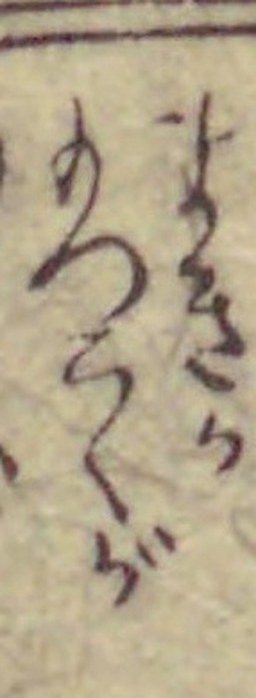もつこくが
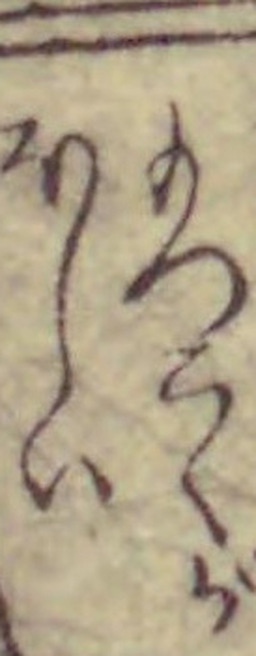ほしい
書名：大通人穴[サガシ] 3巻
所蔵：国立国会図書館 National Diet Library, JAPAN
